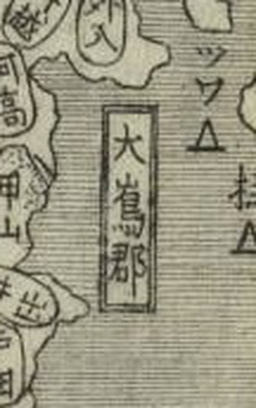大嶌郡

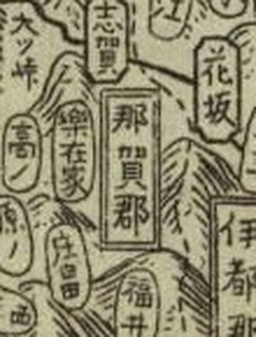那賀郡
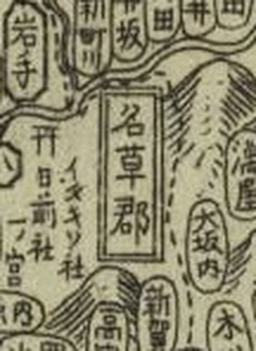名草郡

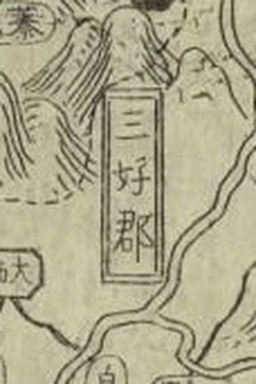三好郡
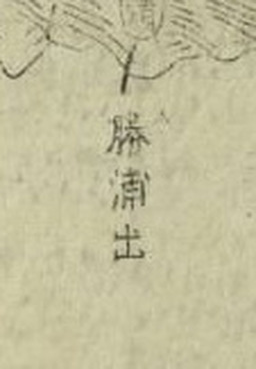勝浦郡

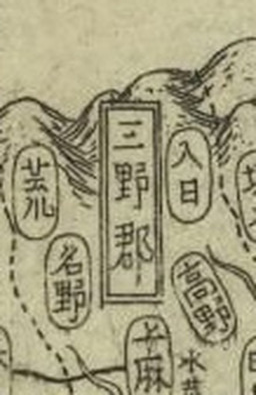三野郡
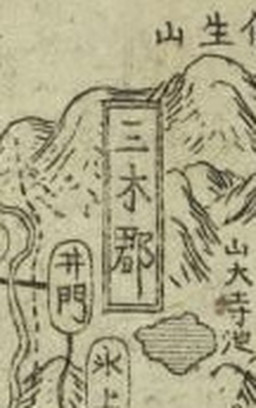三木郡
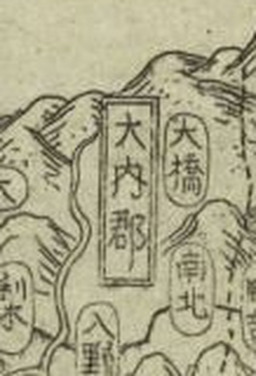大内郡
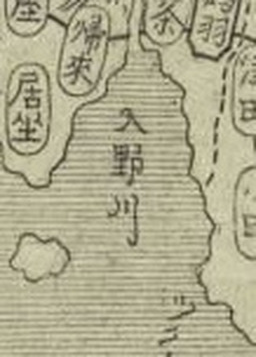大ま川

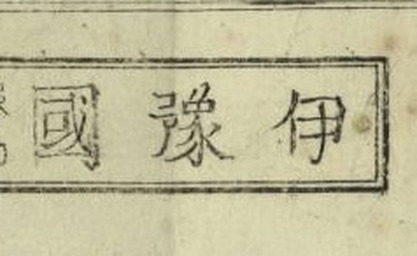伊豫郡

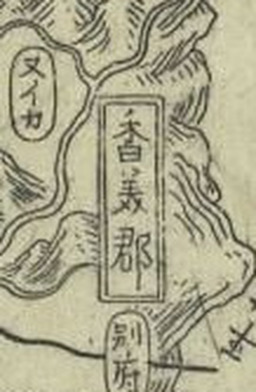香義郡
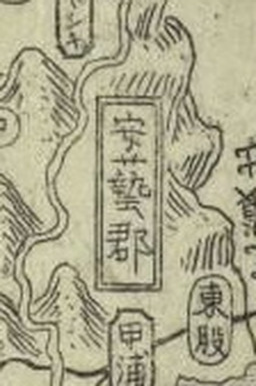安藝郡
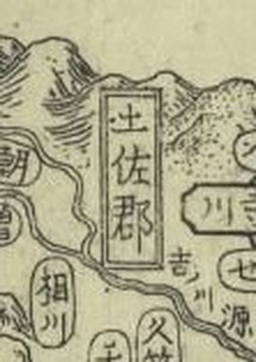土佐郡
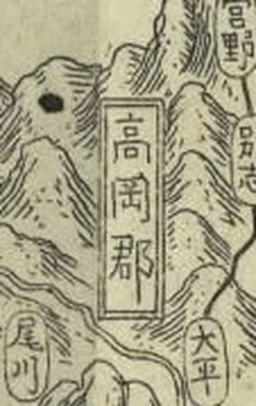高岡郡
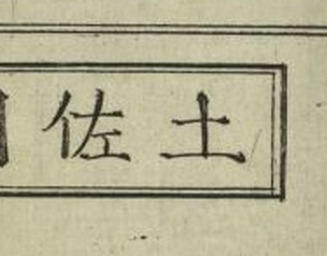土佐郡
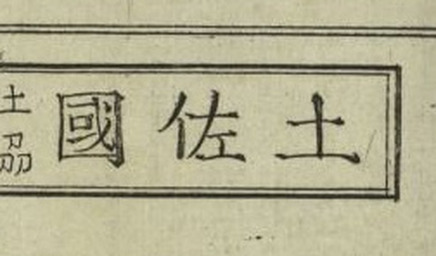土佐郡
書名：大日本国細図 西国之部 下
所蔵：University of the Ryukyus Library
